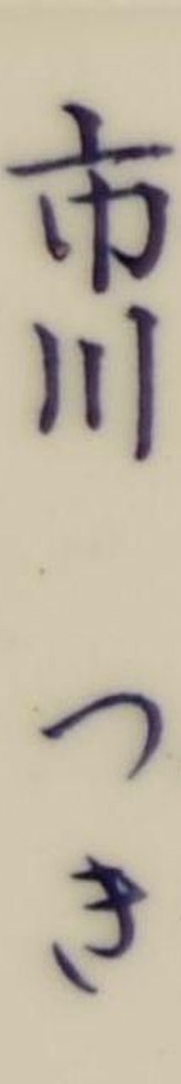市川つき
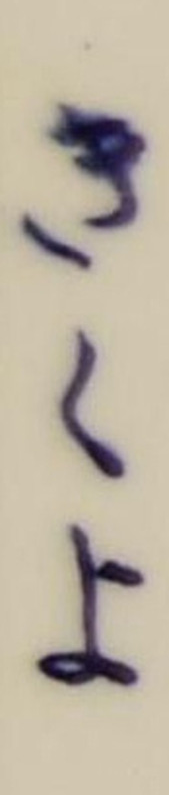きくよ

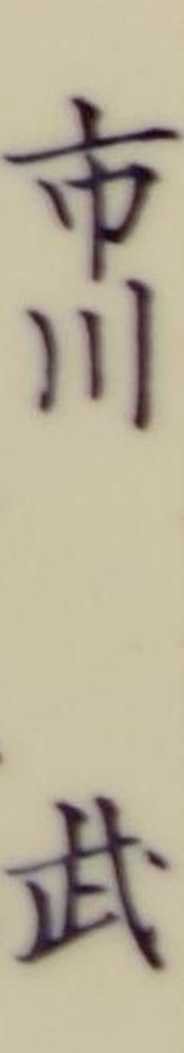市川武
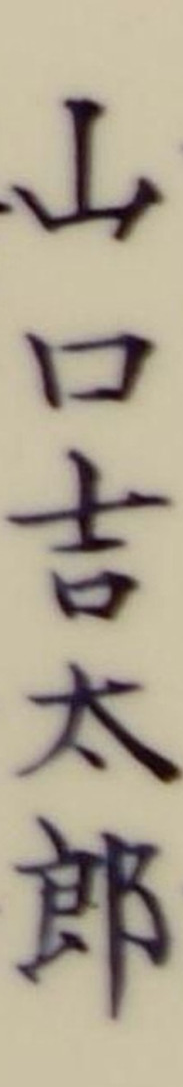山口吉太郎
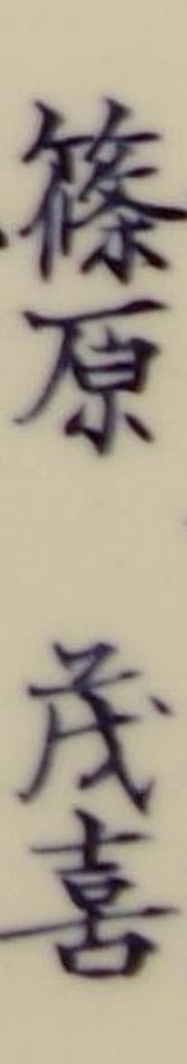篠原茂喜
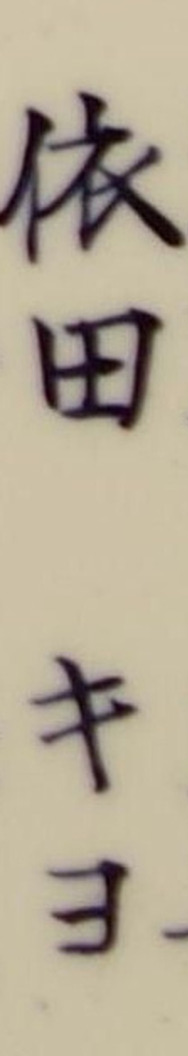依田キヨ
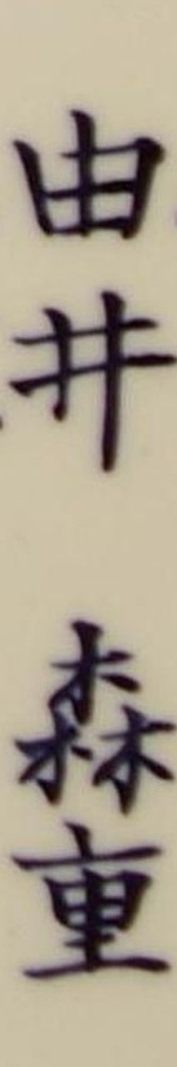由井森重
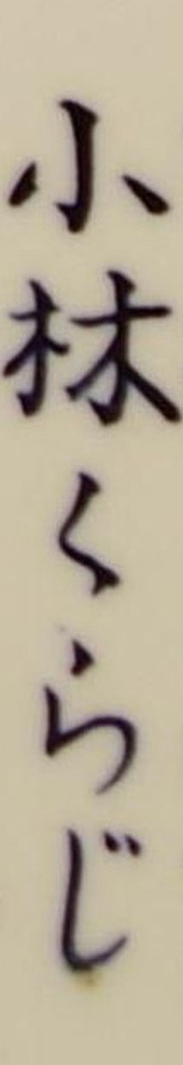小林くらじ
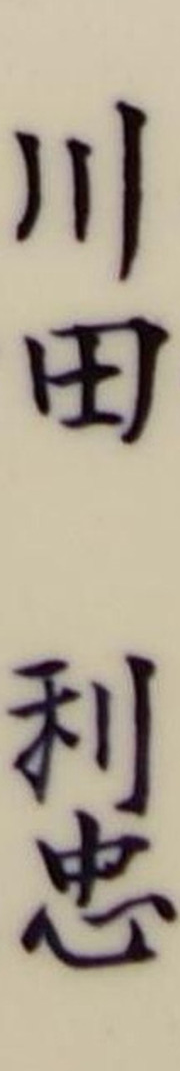川田利忠
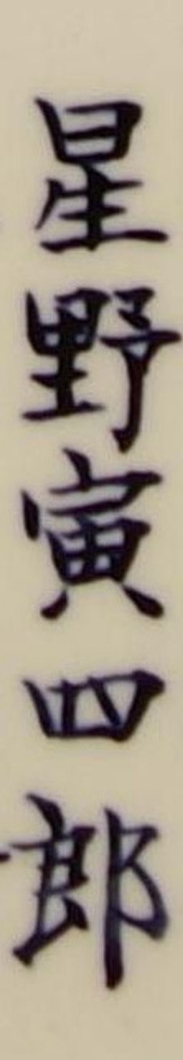星野寅四郎
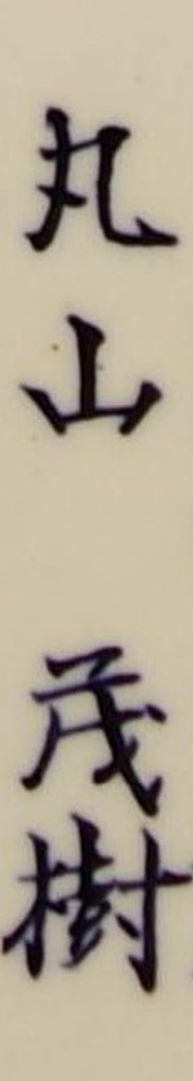丸山茂樹
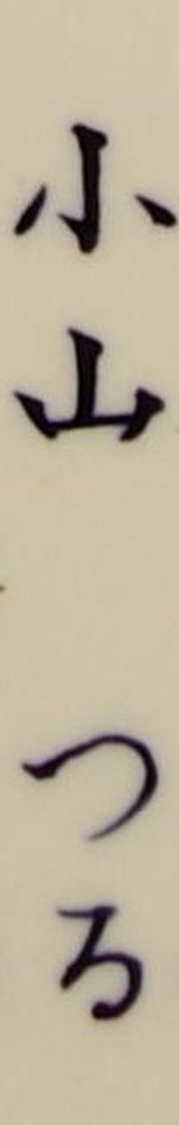小山つる
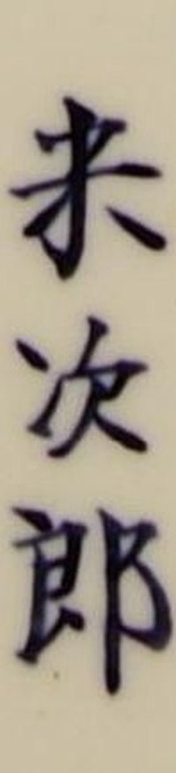米次郎
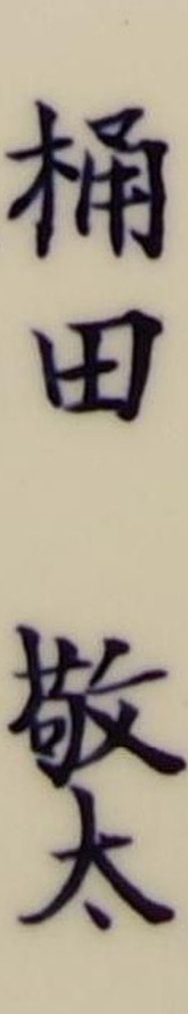桶田敬太
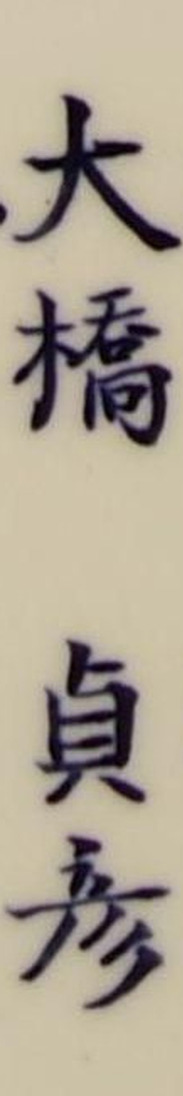大橋貞彦
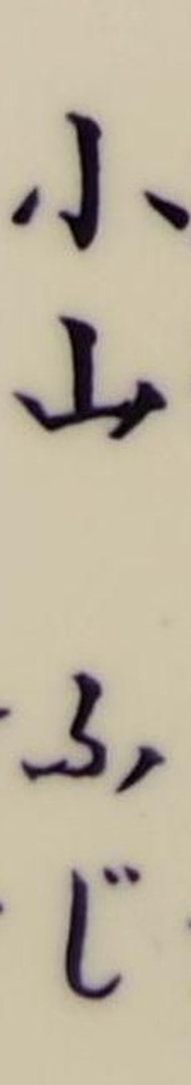小山ふじ
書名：A~D
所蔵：koyasan kongobuji
